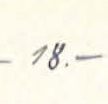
18.
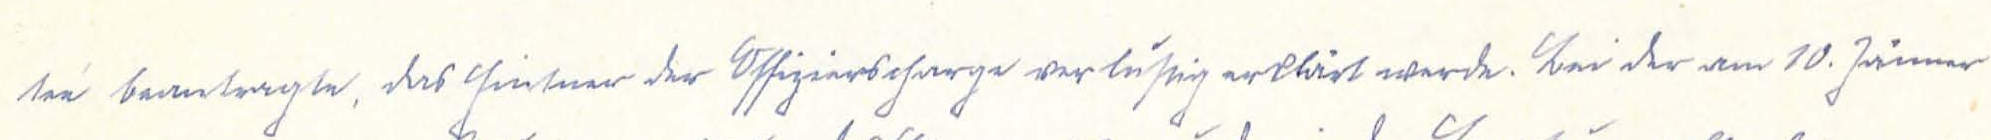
tee beantragte, das Hintner der Offizierscharge verlustig erklärt werde. Bei der am 10. Jänner
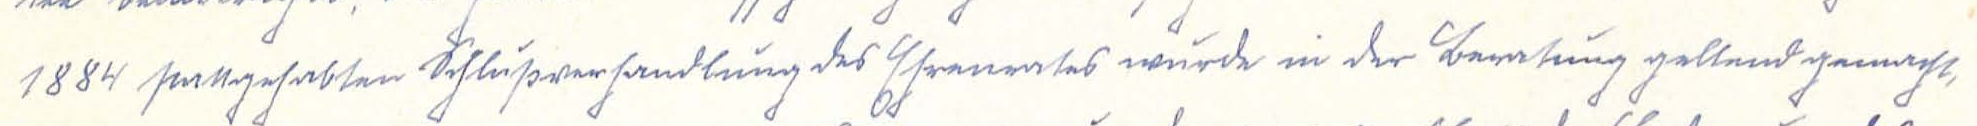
1884 stattgehabten Schlußverhandlung des Ehrenrates wurde in der Bewertung geltend gemacht,
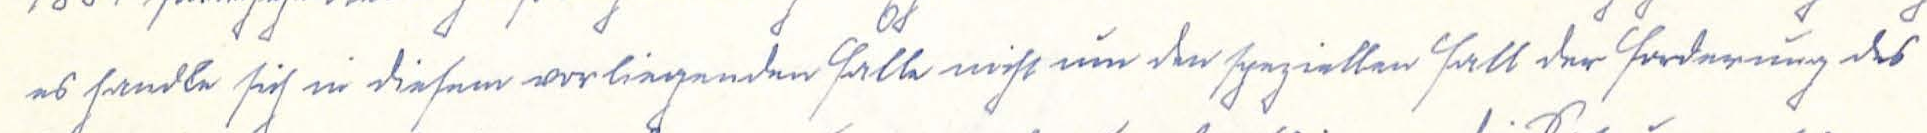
es handle sich in diesem vorliegenden Falle nicht um den speziellen Fall der Forderung des
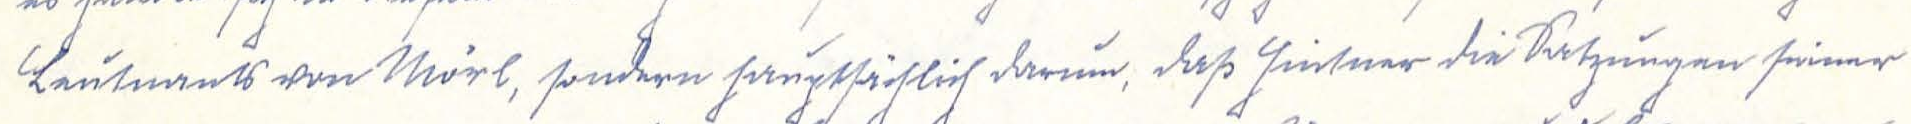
Leutnants von Mörl, sondern hauptsächlich darum, daß Hintner die Satzungen seiner
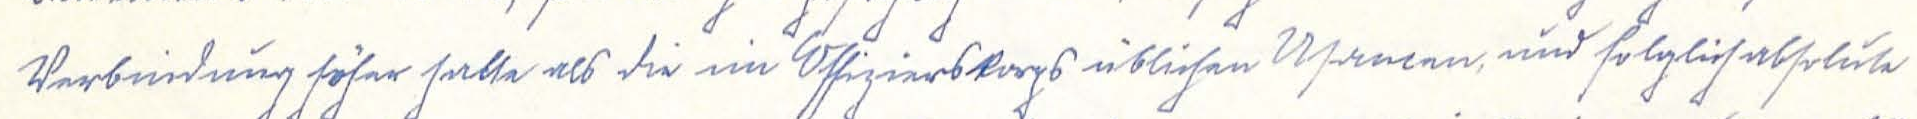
Verbindung höher halte als die im Offizierskorps üblichen Usancen und folglich absolute
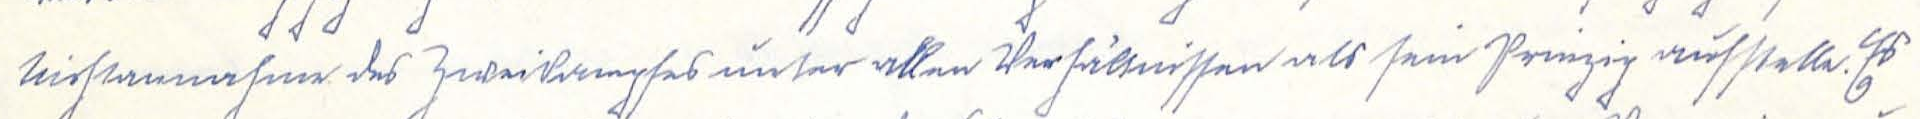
Nichtannahme des Zweikampfes unter allen Verhältnissen als sein Prinzip aufstelle. Es
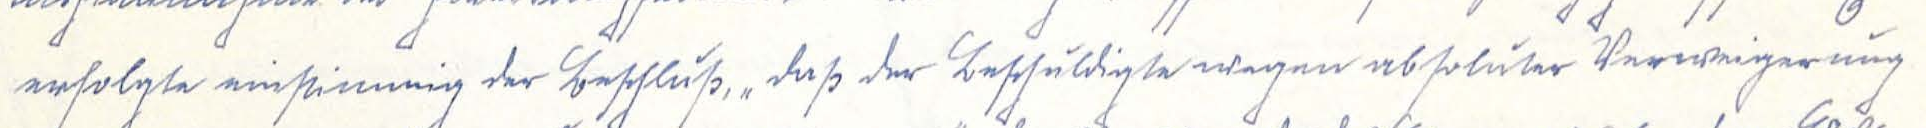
erfolgte einstimmig der Beschluss, "daß der Beschuldigte wegen absoluter Verweigerung
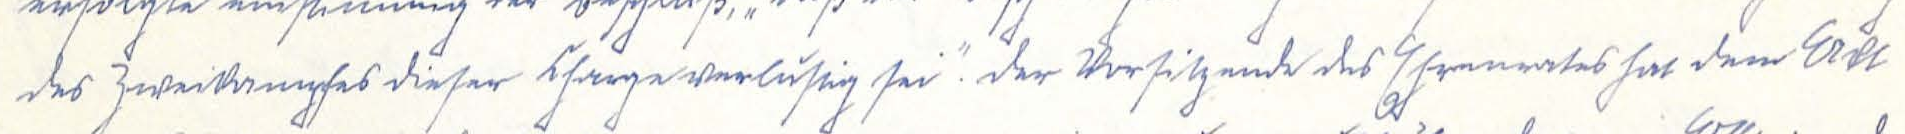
des Zweikampfes dieser Charge verlustig sei". Der Vorsitzende des Ehrenrats hat dem Akt
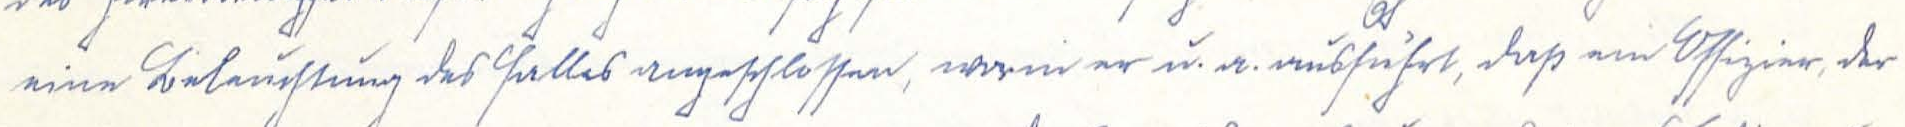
eine Beleuchtung des Fallens angeschlossen, worin er u. a. ausführt, daß ein Offizier, der
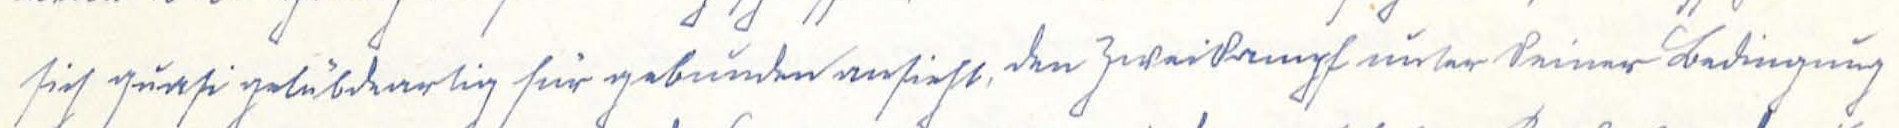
sich quasi gelübdeartig für gebunden ersieht, den Zweikampg unter keiner Bedingung
